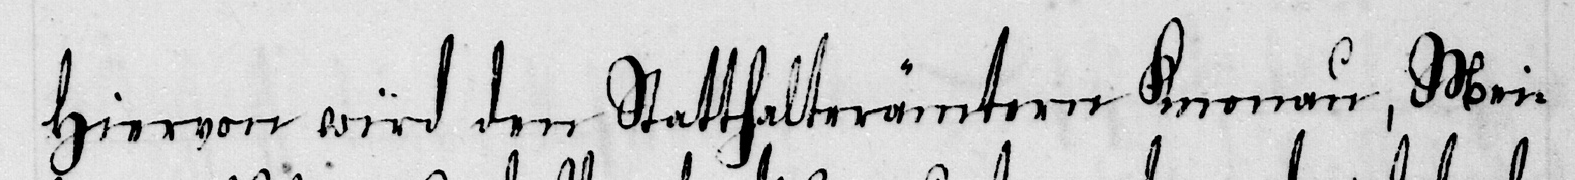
Hiervon wird den Statthalterämtern Knonau, Mei¬
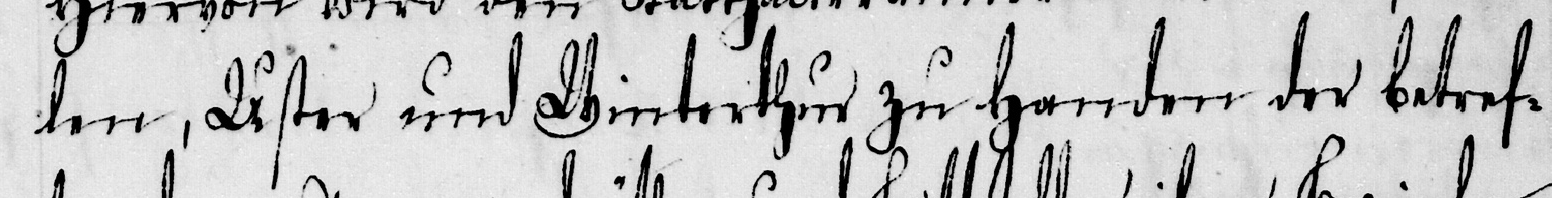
len, Uster und Winterthur zu Handen der betref¬
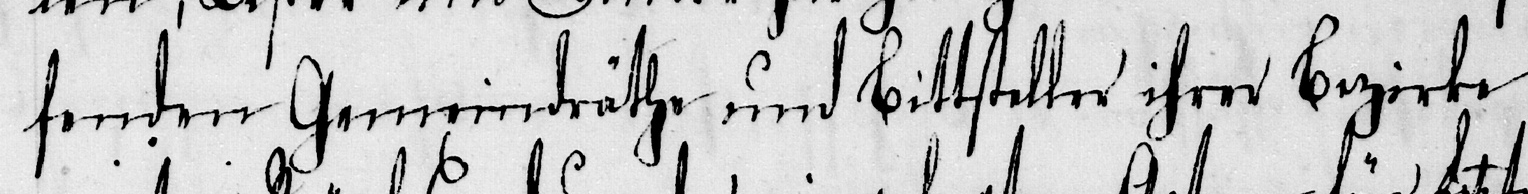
fenden Gemeindräthe und Bittsteller ihrer Bezirke
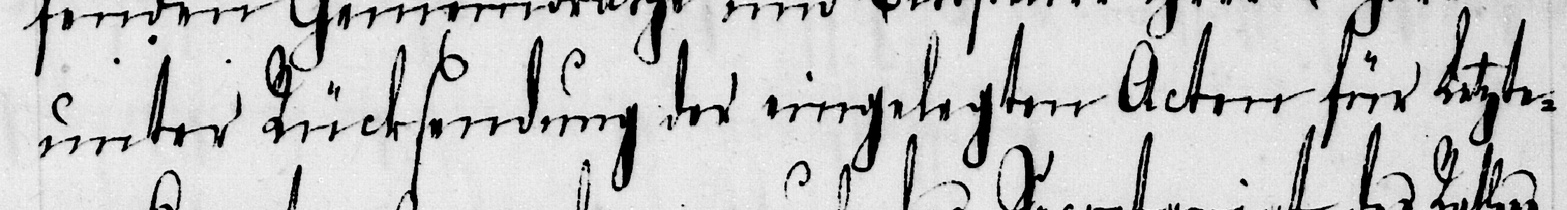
unter Rücksendung der eingelegten Acten für Letzte¬
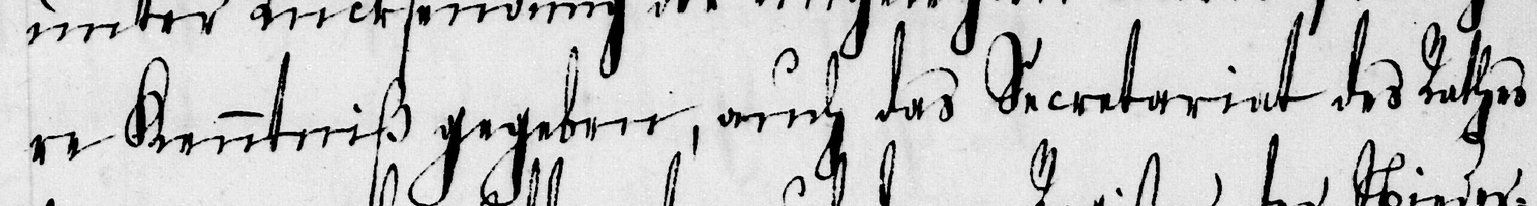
re Kenntniß gegeben, auch das Secretariat des Rathes
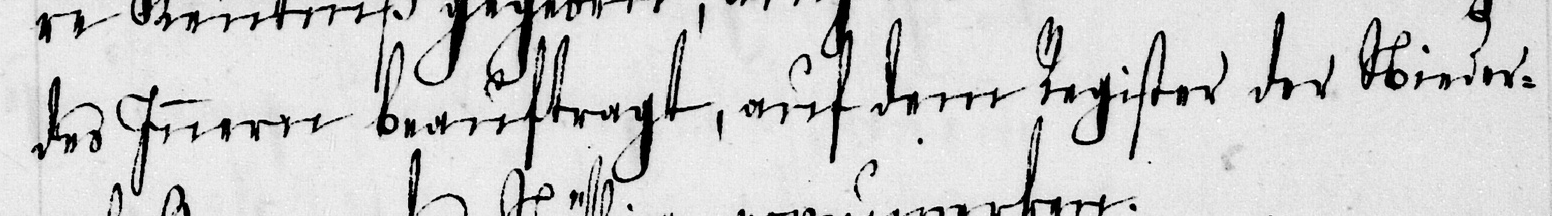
des Innern beauftragt, auf dem Register der Nieder¬
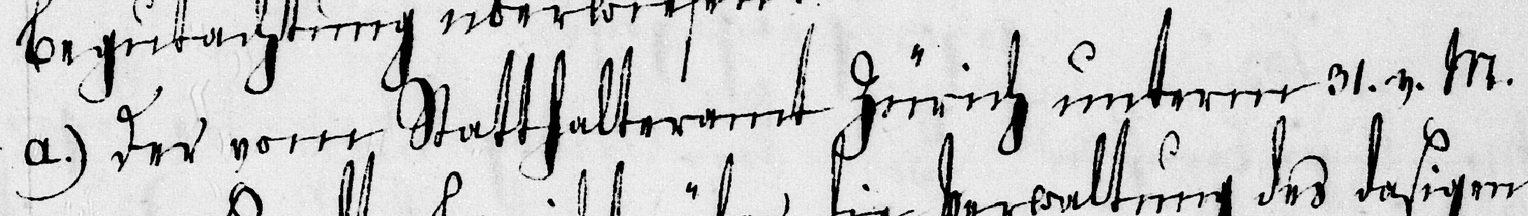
a.) Der vom Statthalteramt Zürich unterm 31. v. M.
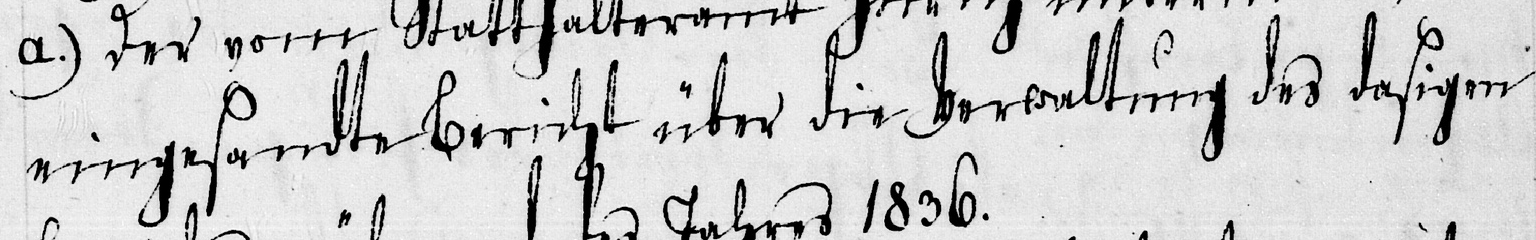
eingesandte Bericht über die Verwaltung des dasigen
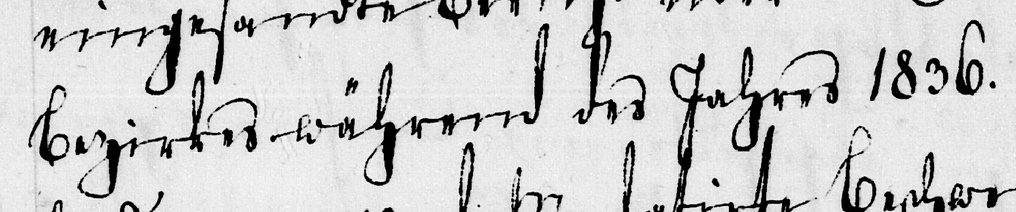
Bezirkes während des Jahres 1836.
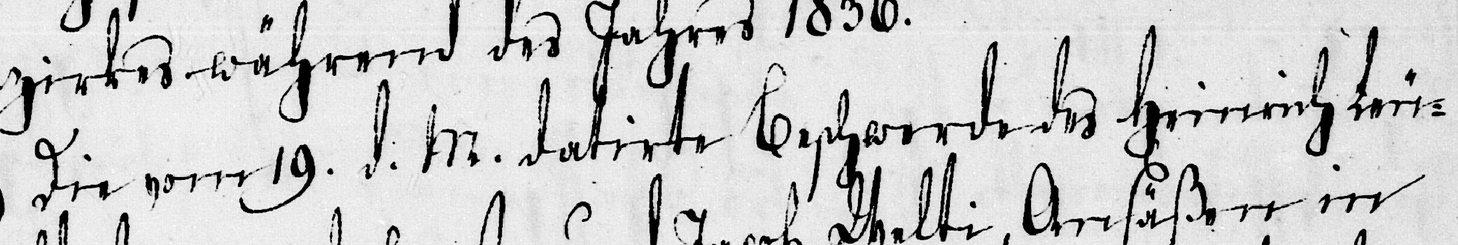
Die vom 19. d. M. datirte Beschwerde des Heinrich Leu¬
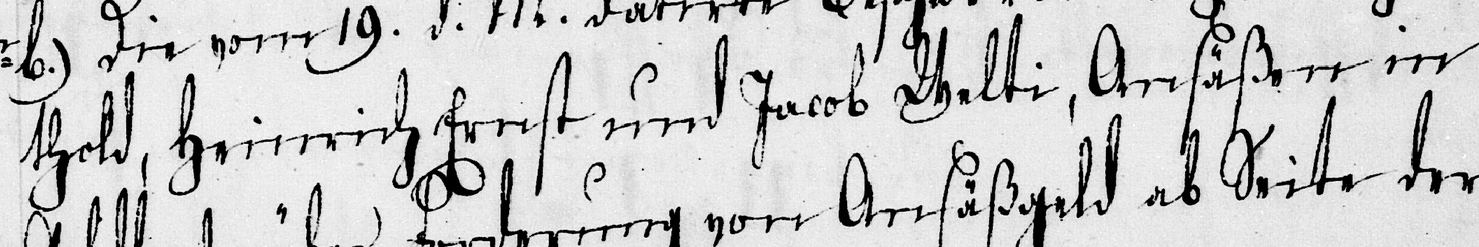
thold, Heinrich Ernst und Jacob Welti, Ansäßen in
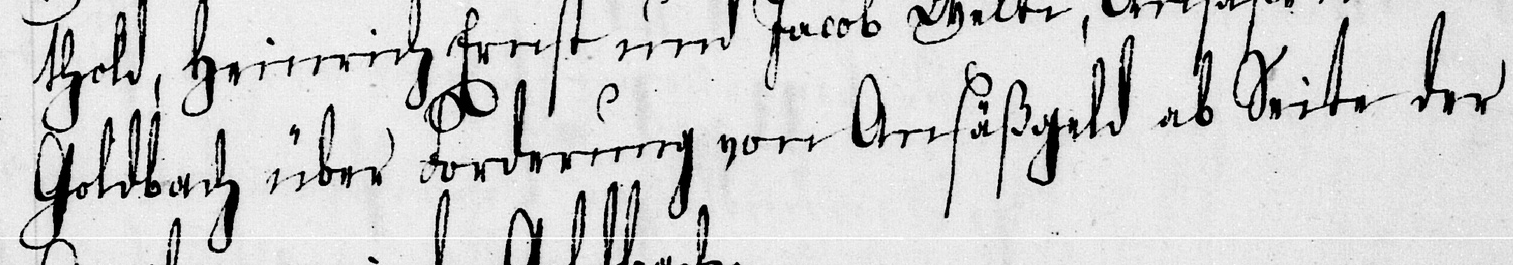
Goldbach über Forderung von Ansäßgeld ab Seite der
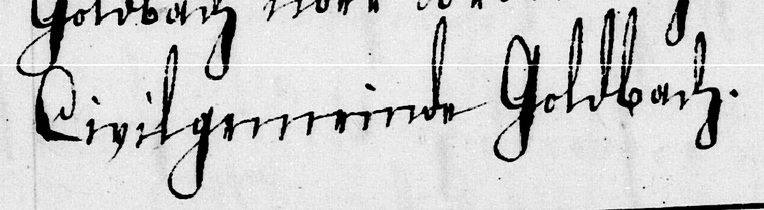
Civilgemeinde Goldbach.
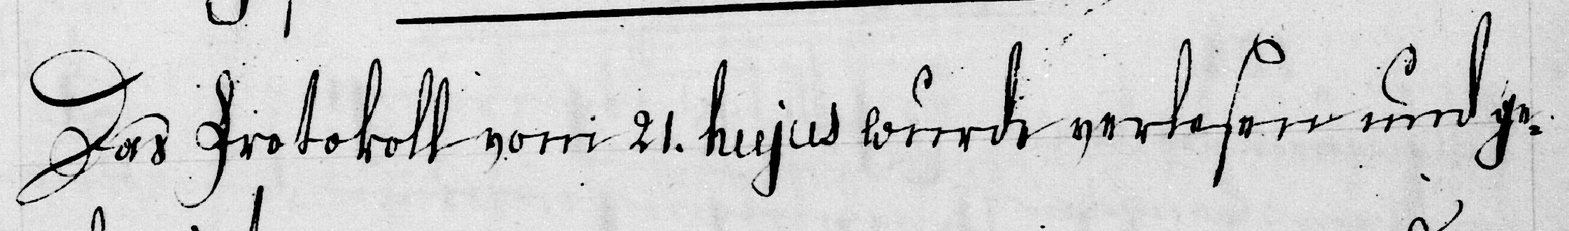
Das Protokoll vom 21. hujus wurde verlesen und ge¬
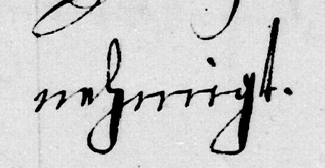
nehmigt.
